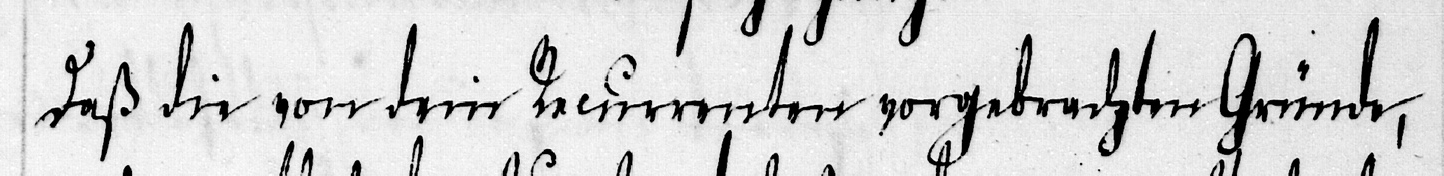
Daß die von dem Recurrenten vorgebrachten Gründe,
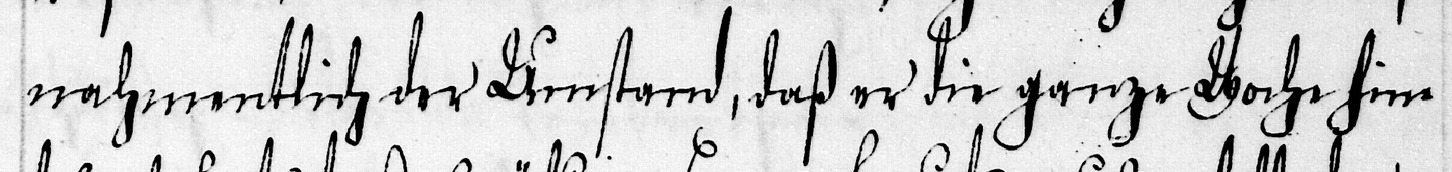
nahmentlich der Umstand, daß er die ganze Woche hin¬
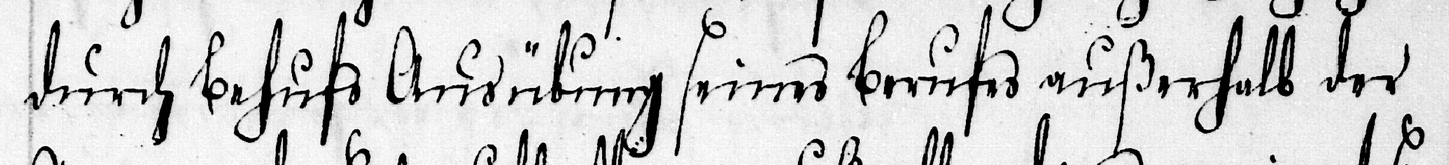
durch Behufs Ausübung seines Berufes außerhalb der
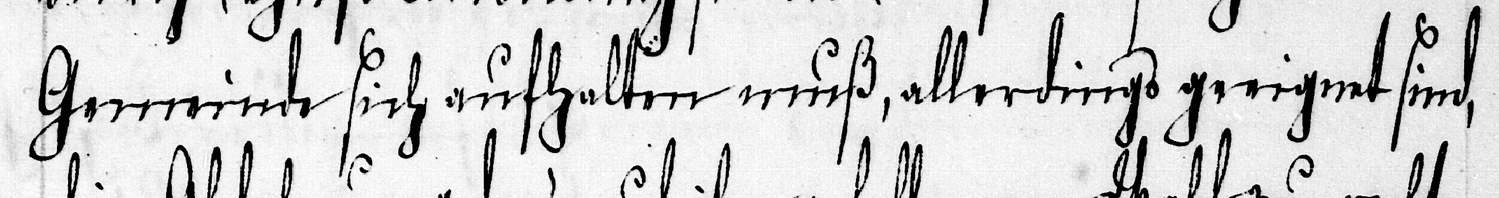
Gemeinde sich aufhalten muß, allerdings geeignet sin¬
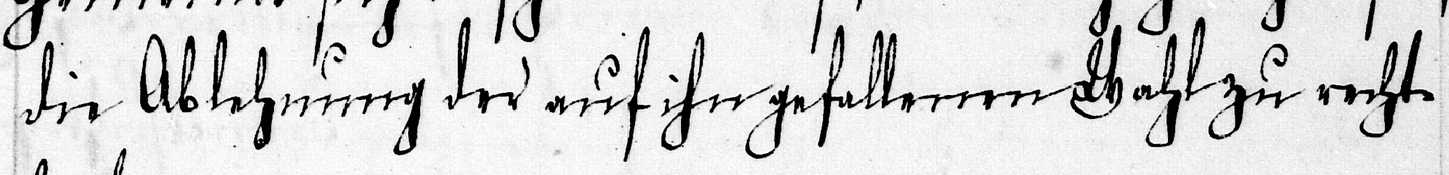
die Ablehnung der auf ihn gefallenen Wahl zu recht¬
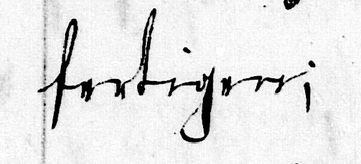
fertigen;
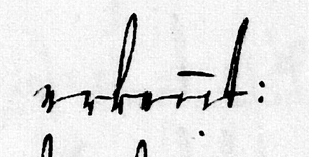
erkennt:
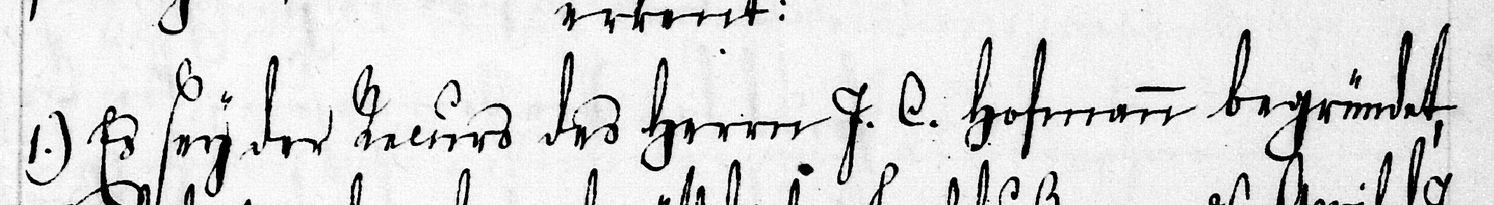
1.) Es sey der Recurs des Herrn J. C. Hofmann begründet,
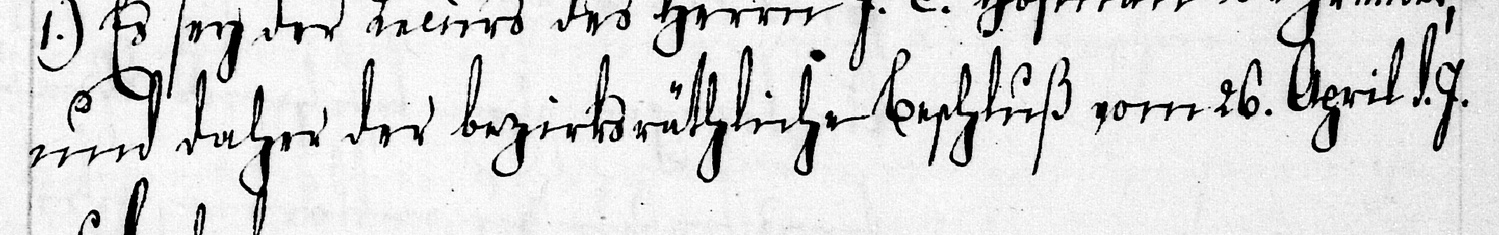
und daher der bezirksräthliche Beschluß vom 26. April d.
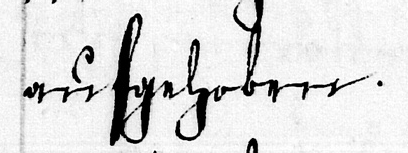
aufgehoben.
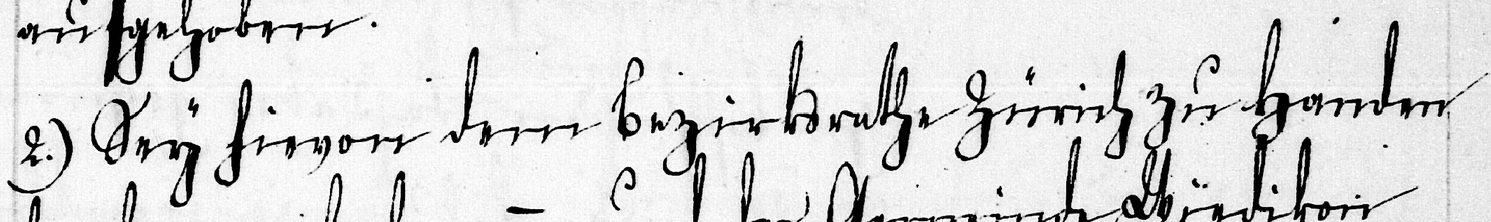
2.) Sey hievon dem Bezirksrathe Zürich zu Handen
